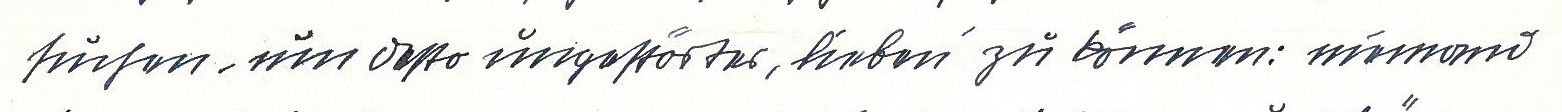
suchen, um desto ungestörter „lieben“ zu können: niemand
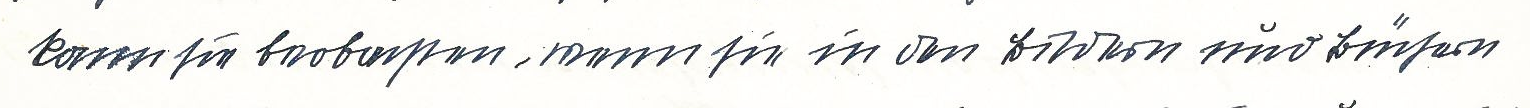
kann sie beobachten, wenn sie in den Bildern und Büchern
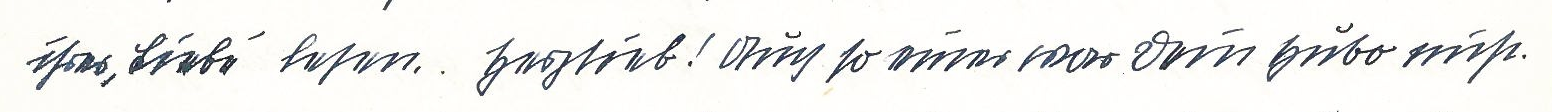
ihrer „Liebe“ lesen. Herzlieb! Auch so einer war Dein Hubo nicht.
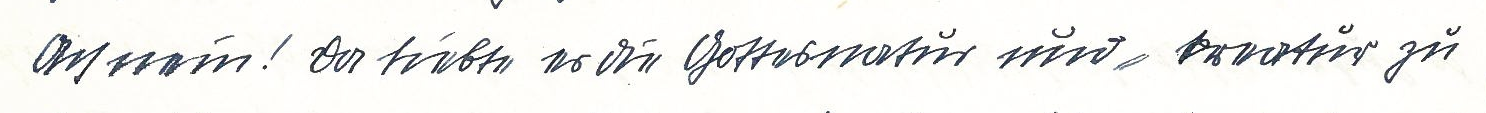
Ach nein! Da liebte er die Gottesnatur und -kreatur zu
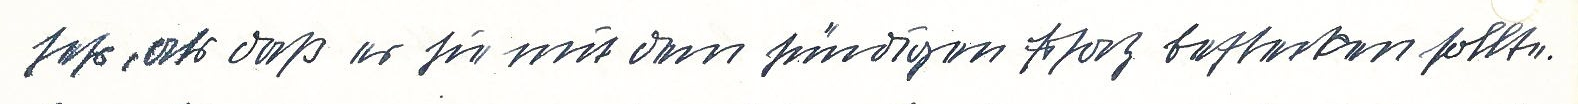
sehr, als daß er sie mit dem sündigen Ersatz beflecken sollte.
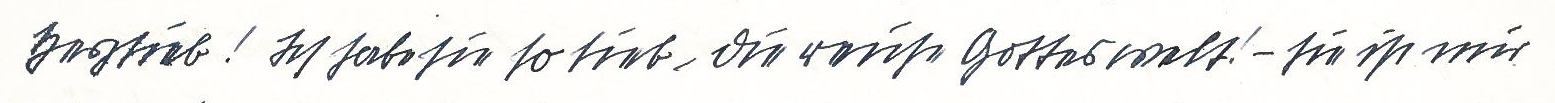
Herzlieb! Ich habe sie so lieb, die reiche Gotteswelt! – sie ist mir
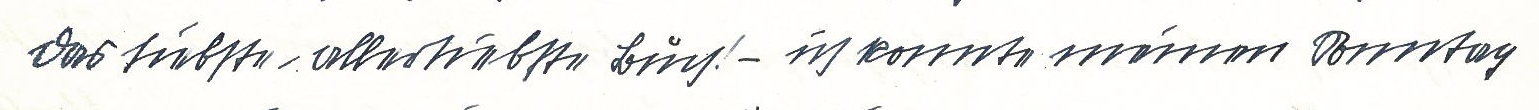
das liebste, allerliebste Buch! – Ich konnte meinen Sonntag
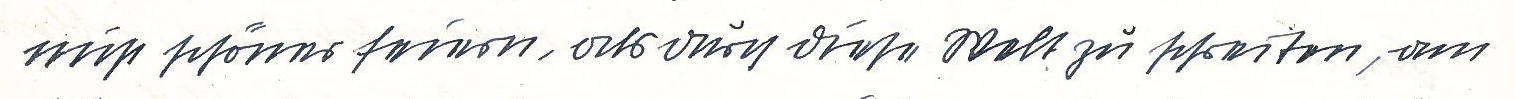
nicht schöner feiern, als durch diese Welt zu schreiten, am
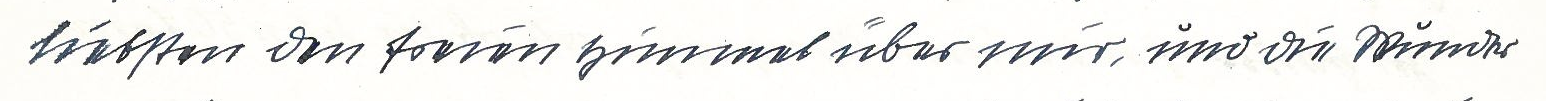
liebsten den freien Himmel über mir, und die Wunder
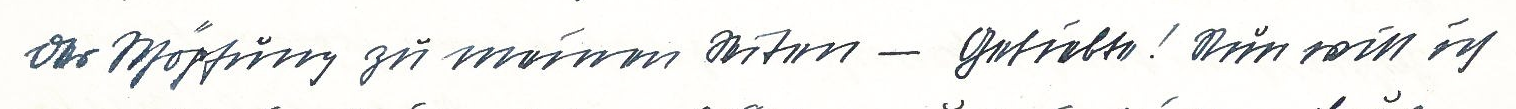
der Schöpfung zu meinen Seiten – Geliebte! Nun will ich
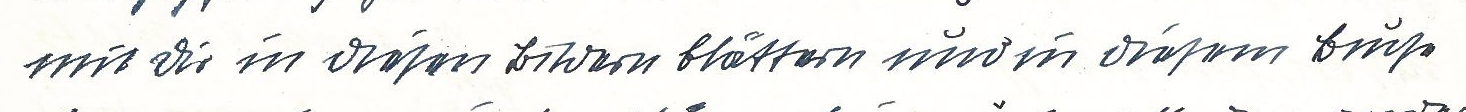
mit Dir in diesen Bildern blättern und in diesem Buche
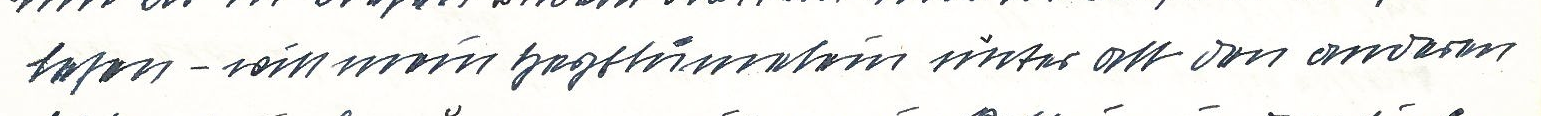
lesen – will mein Herzblümlein unter all den anderen
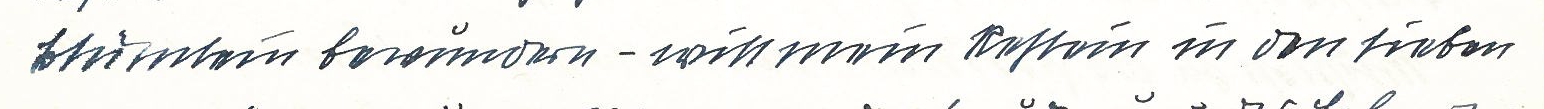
Blümlein bewundern – will mein Rehlein in den lieben
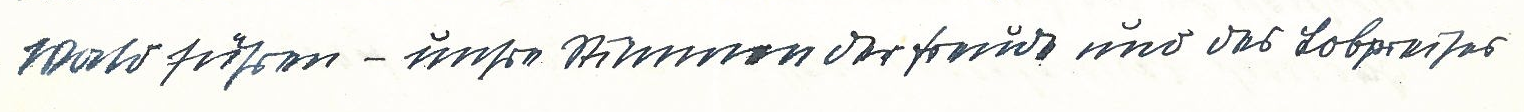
Wald führen – unsre Stimmen der Freude und des Lobpreises
